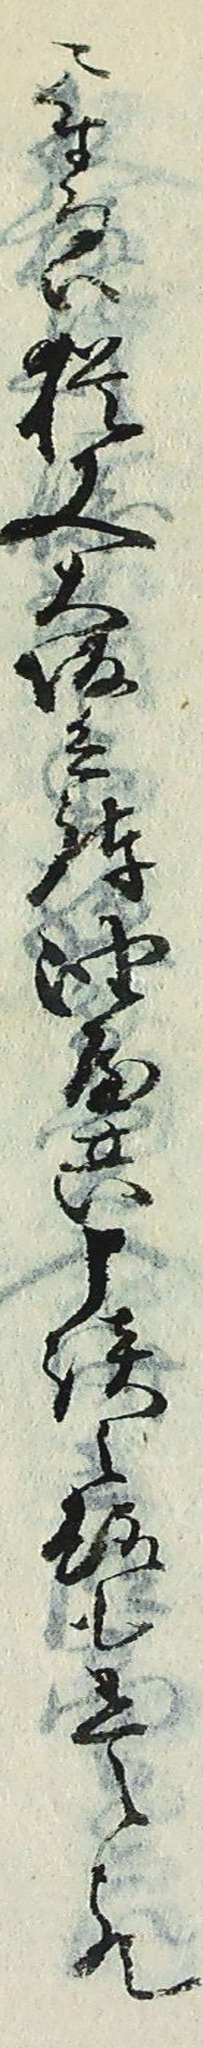ニ付而は猶又大坂兵庫油屋共申談之趣も有之歟
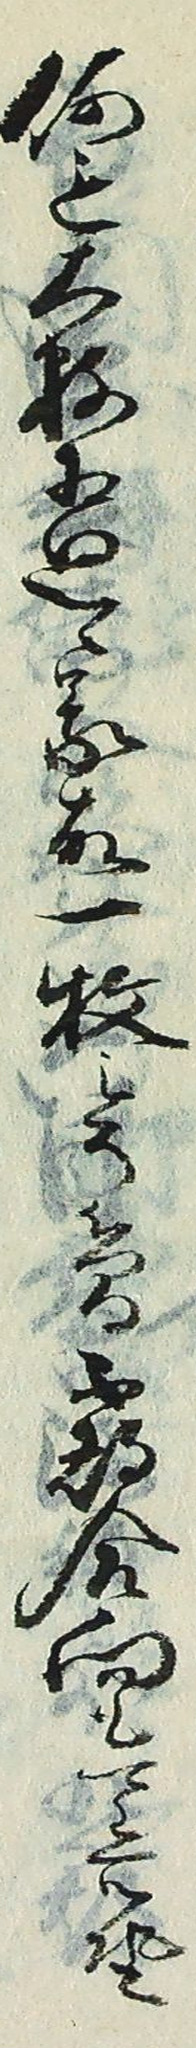何れ大数相廻候義故一牧之了簡不都合向も可有
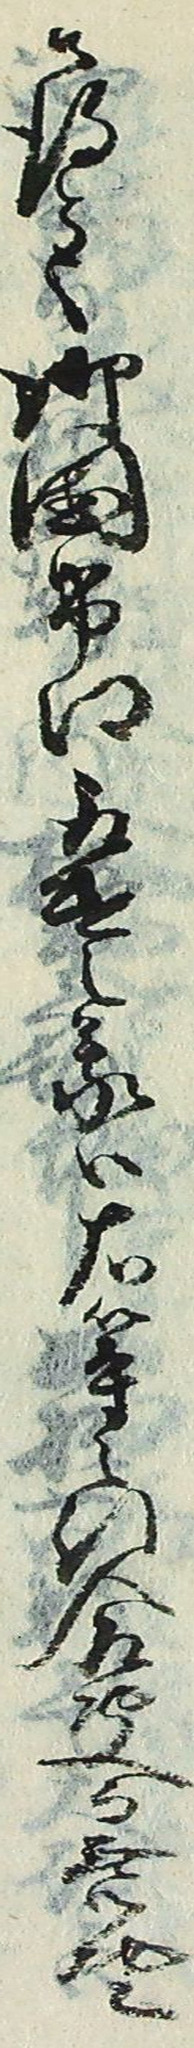候得とも御国市郷取遣之義は右等之引合決而無御坐
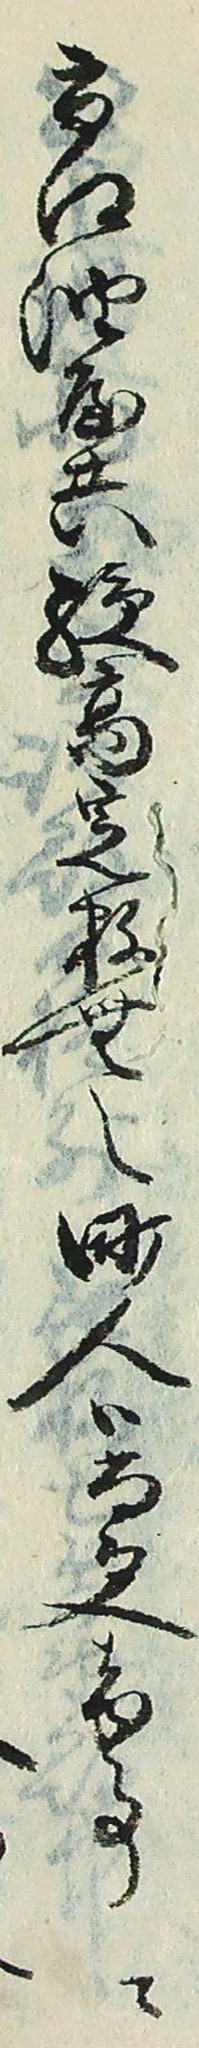市郷油屋共絞高定数無之町人は尚更商事に
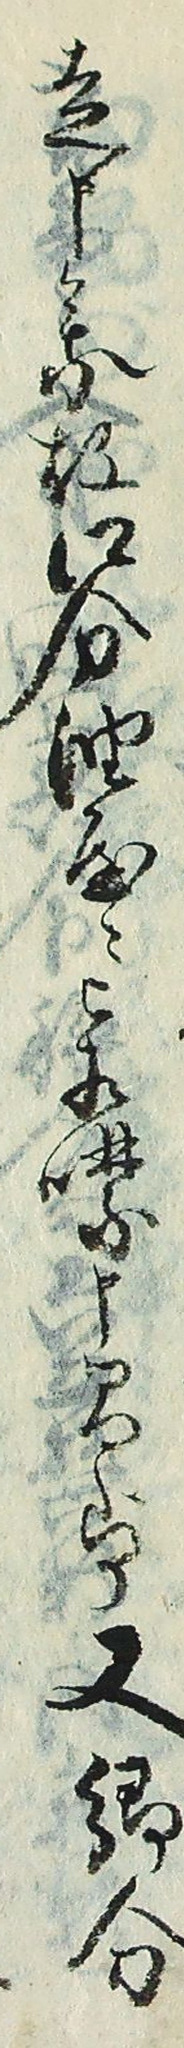走申義故郷分油屋に被相噤申間布又郷分
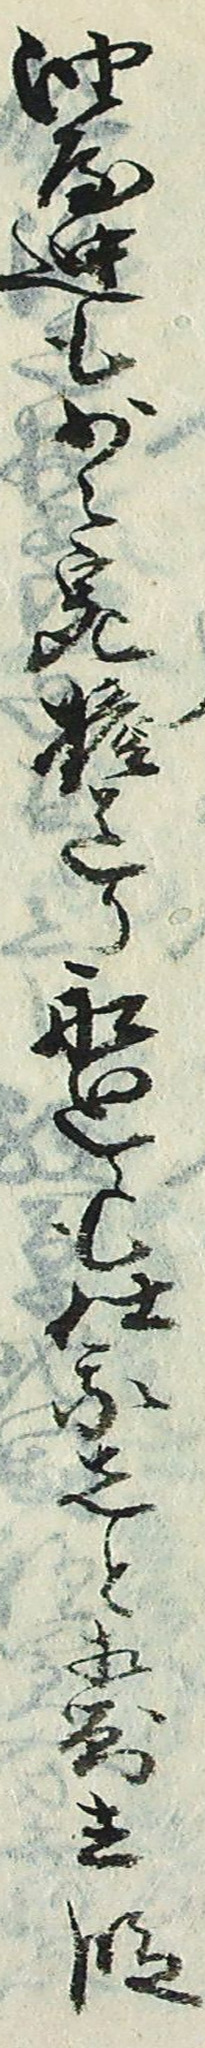油屋迚も少々宛擔送り船廻にも仕義先々相対直
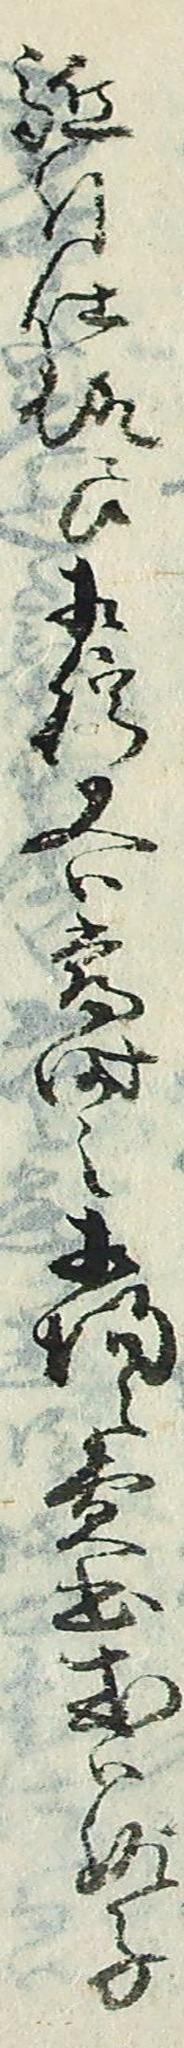駆引仕趣に候相貯又は当時之相場に売出或は銀子
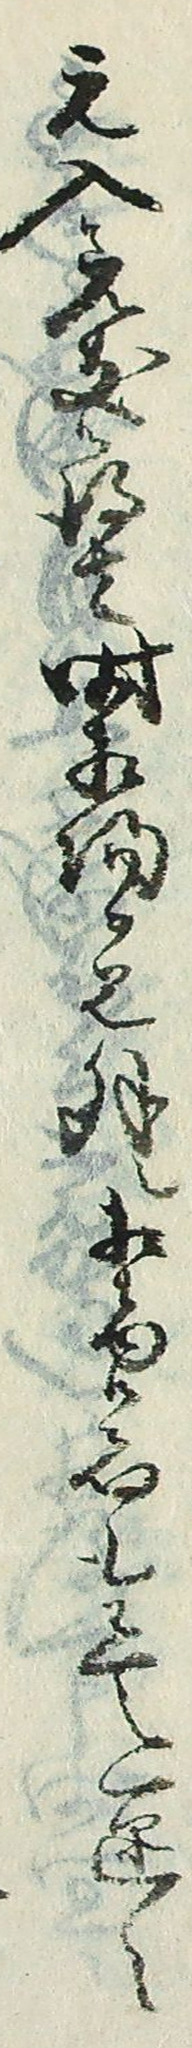元入差支候得者時相場を見外し相商候者も有之
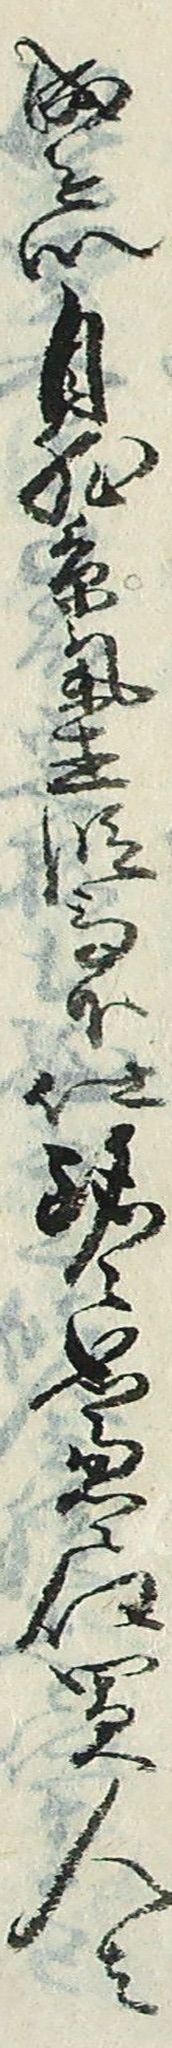成を以自然景気直段高下仕銘々思慮に任買人者

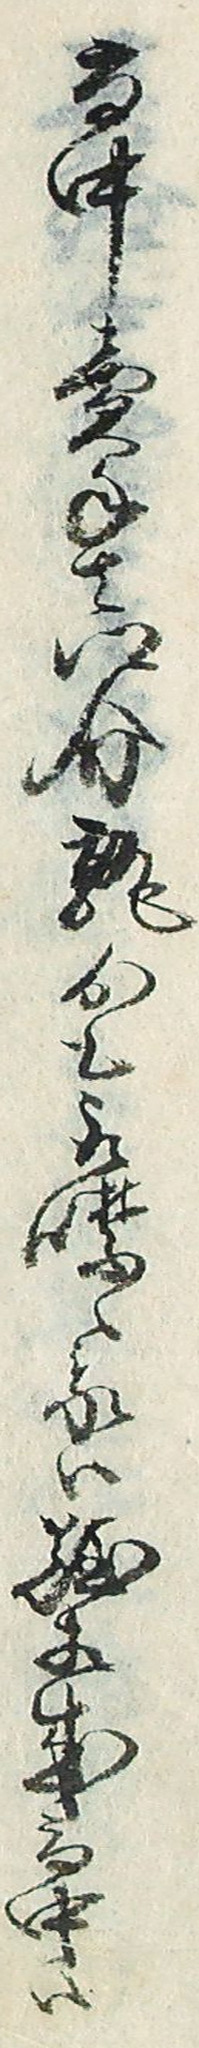市中売手者郷分孰ゟも取噤候義は難相成市中は
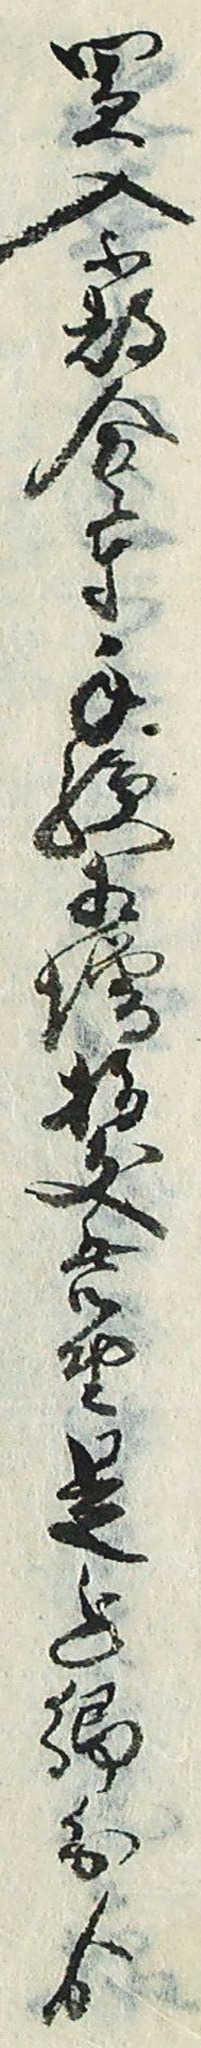買入不都合に付手絞相増指支無御坐是迄郷分ゟ
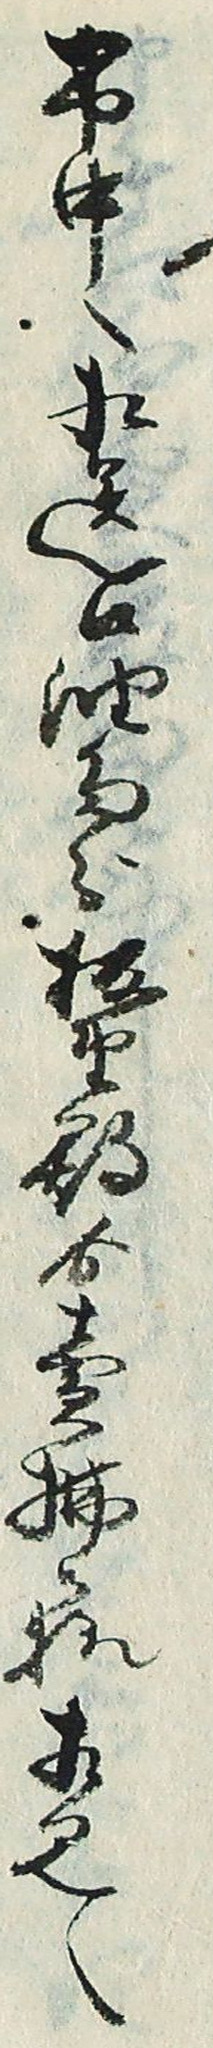市中へ相送候油多分板野郡ゟ売払候様相見へ
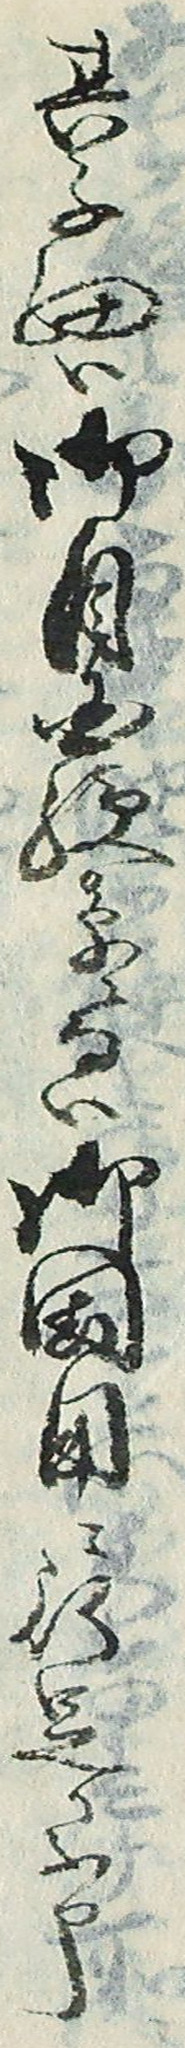其子細は御自国絞草に而は御国用に行足り不申
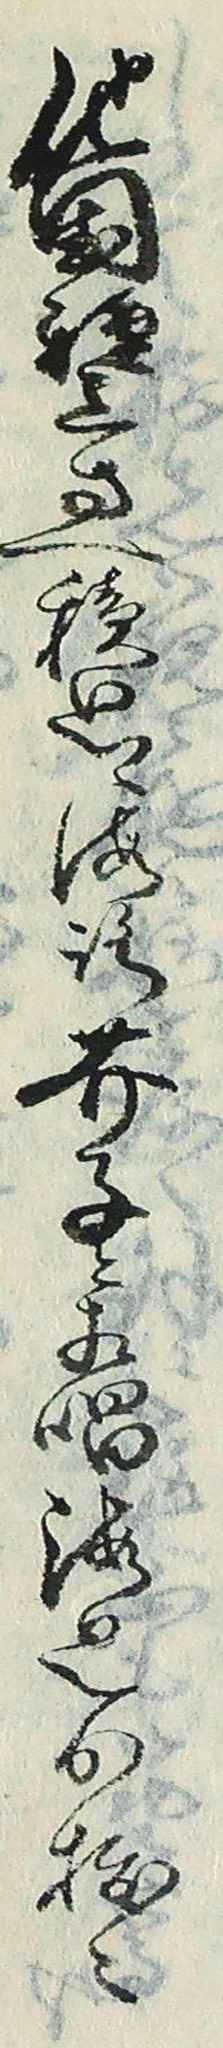他国種上方へ積廻候海路芥子と相唱海廻ゟ抜々
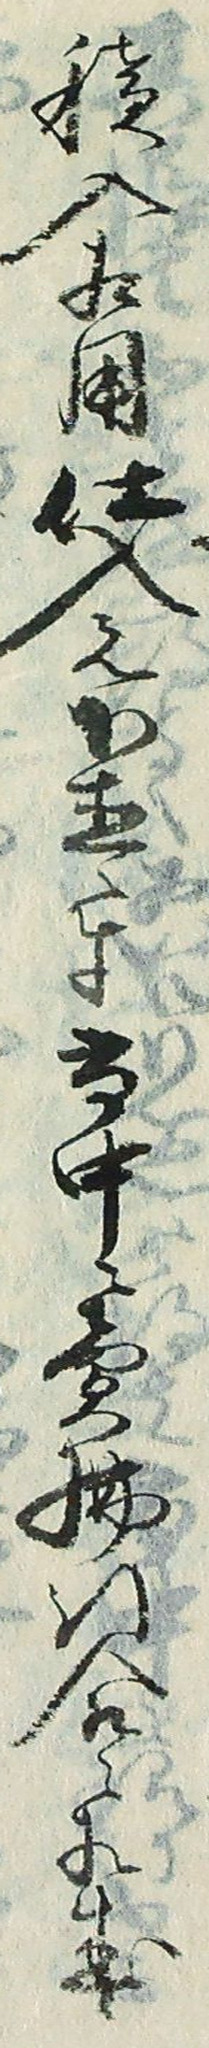積入相用仕入元下直に付市中に売払引合に相成
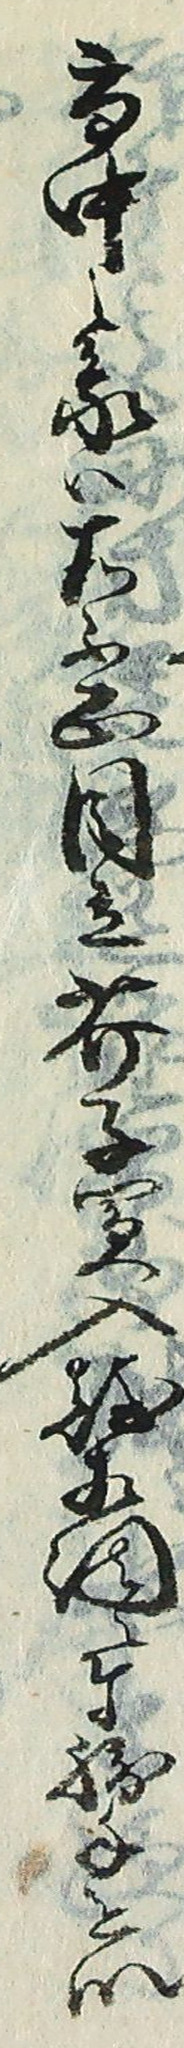市中之義は右不正目立芥子買入難相調に付勝手を以
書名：油稼御取究ニ附御箇條書テ以被仰渡南北同役申談御答書控
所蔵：鳴門教育大学 Naruto University of Education
